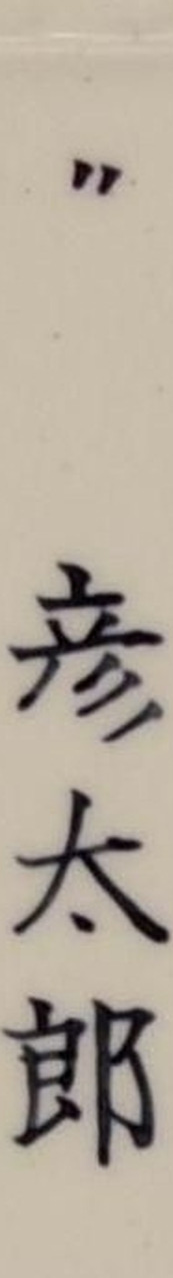彦太郎
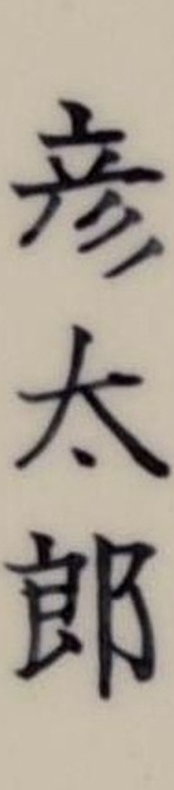彦太郎
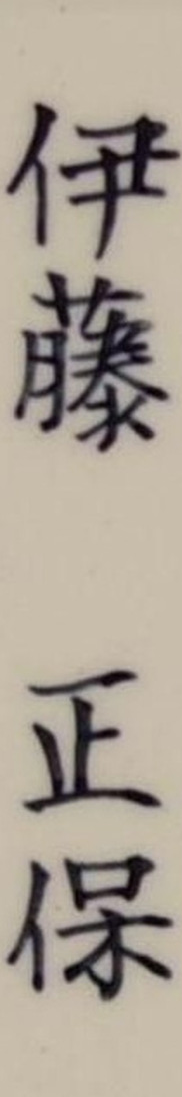伊藤正保
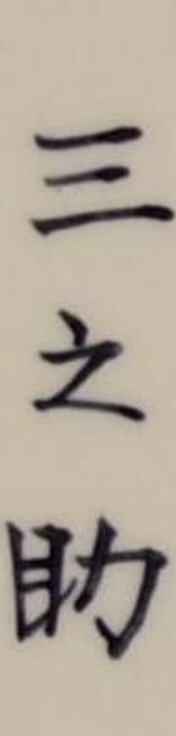三之助
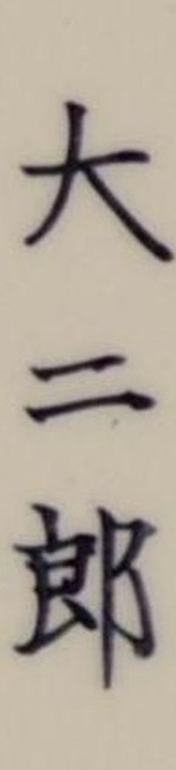大二郎
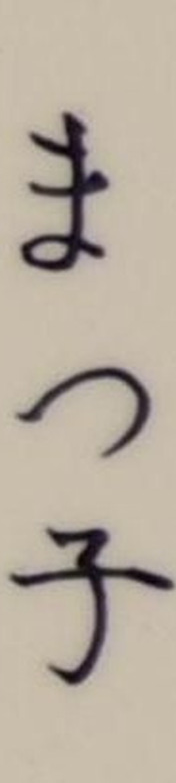まつ子
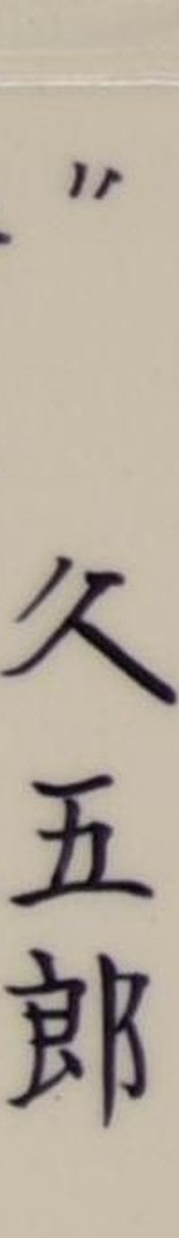久五郎
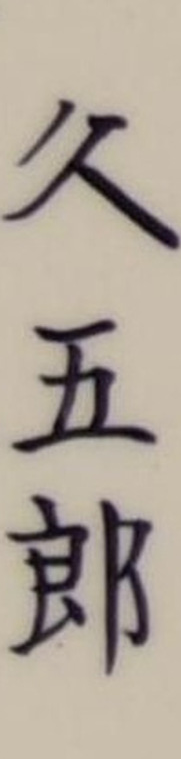久五郎
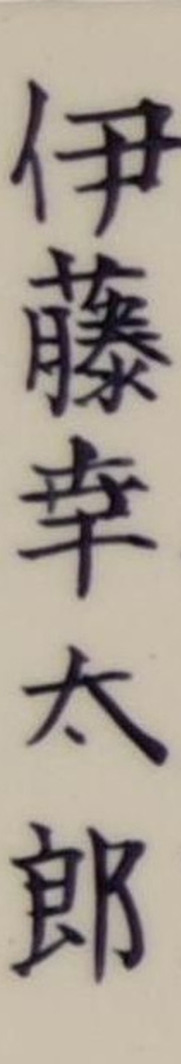伊藤幸太郎
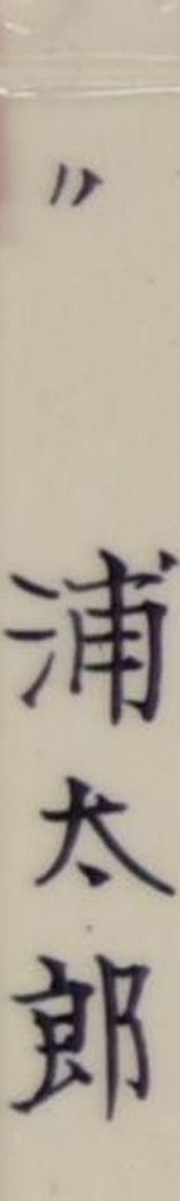浦太郎
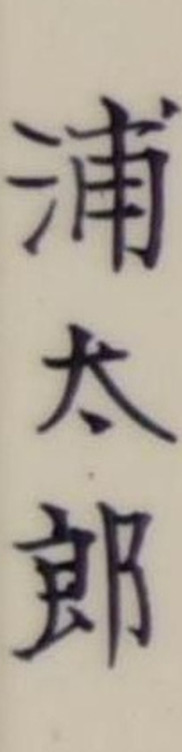浦太郎

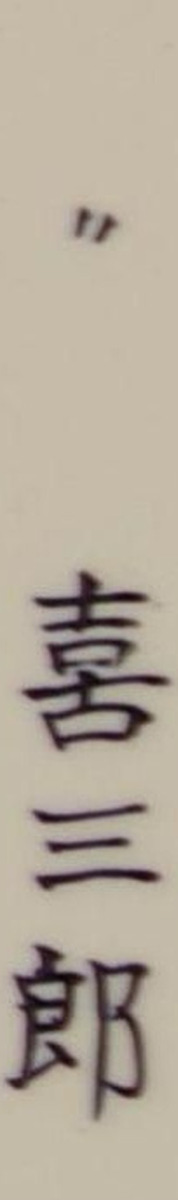喜三郎
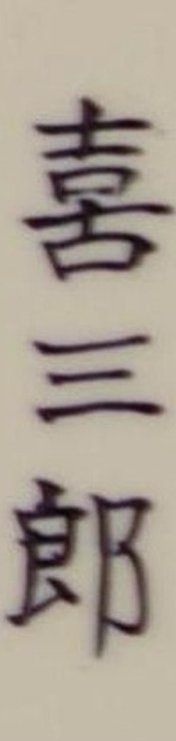喜三郎
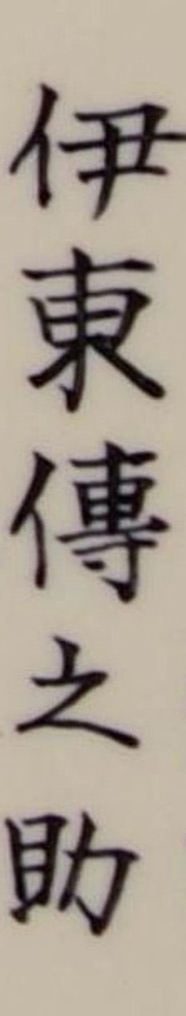伊東傳之助
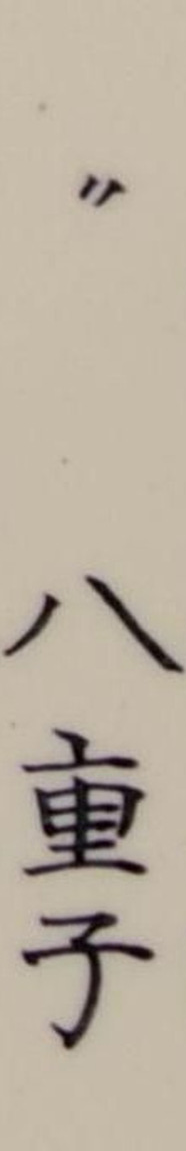八重子
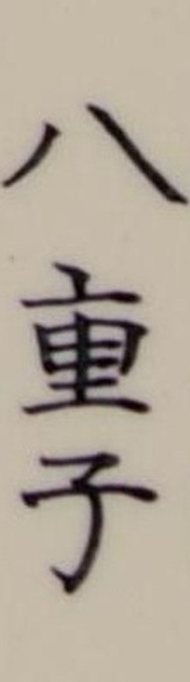八重子
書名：M~S
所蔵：高野山金剛峯寺
